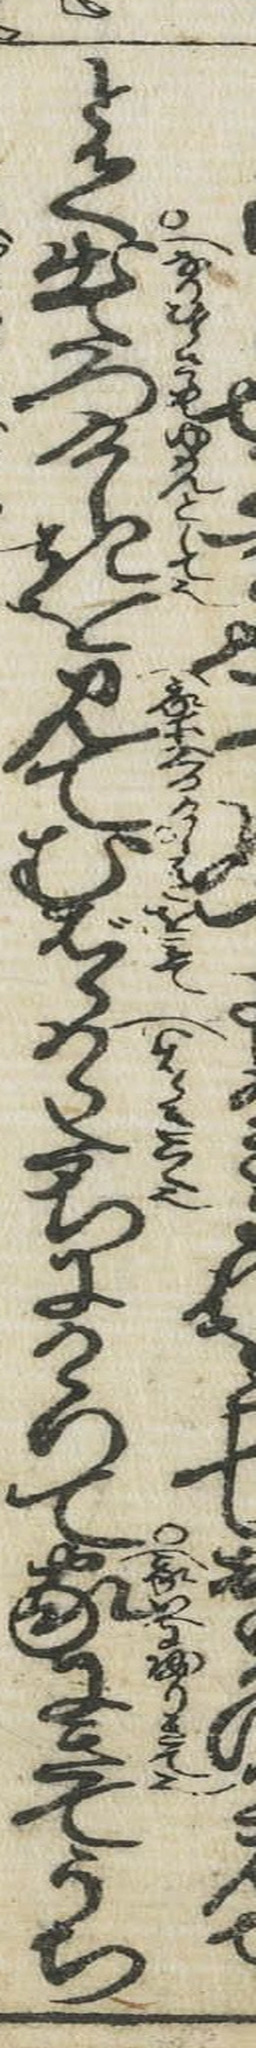とて。出たつけしきを見て。むばらからたちにかゝりて。家にきてうち
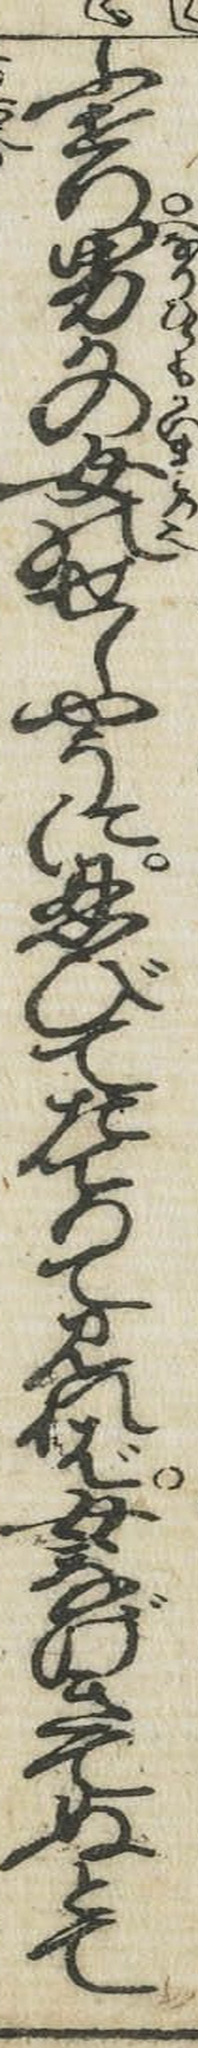ふせり。男かの女のせしやうに。忍びてたてりて見れば。女なげきてぬとて
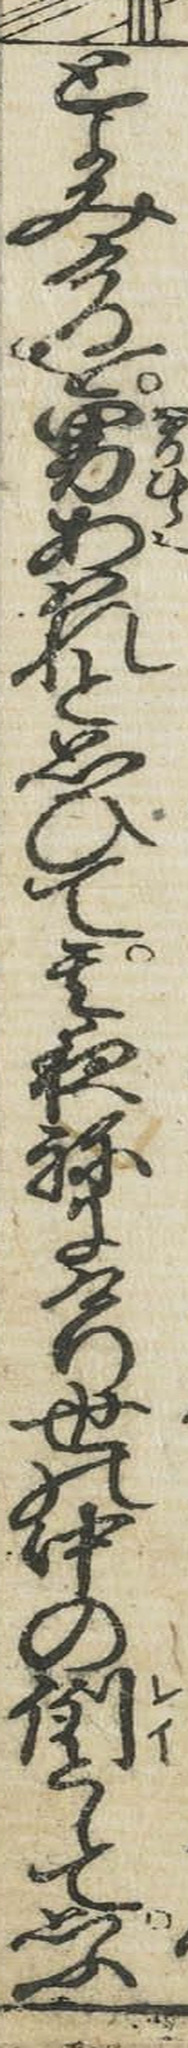とよみけるを。男あはれと思ひて。其夜ねにけり世の中の例として。思ふ
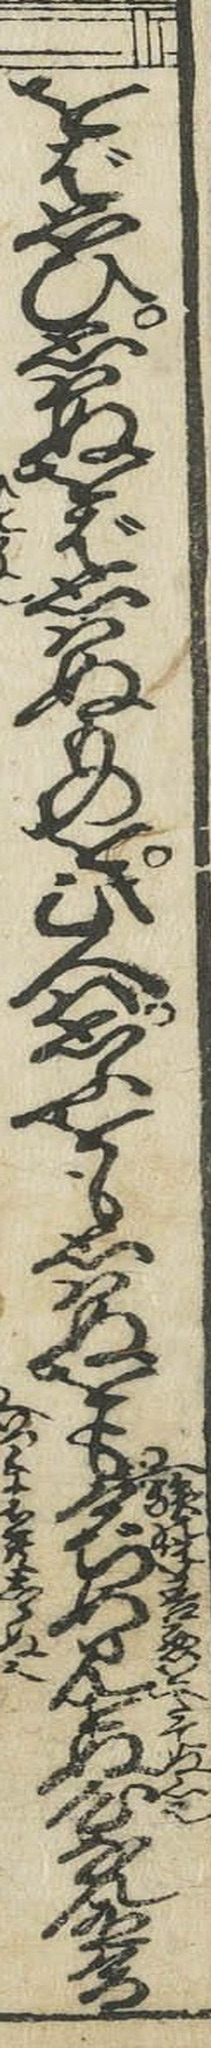をば思ひ。思はぬをば思はぬものを。此人は。思ふをも思はぬをも。けぢめみせぬ心なん有ける
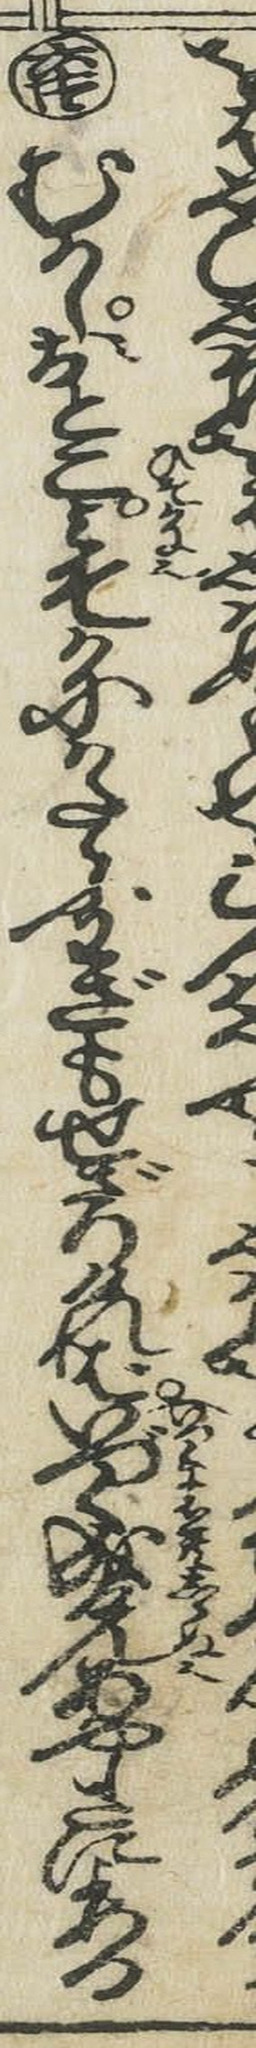(六十四)むかし。おとこ。みそかにかたらふわざもせざりければ。いづく成けんあやしさによめる
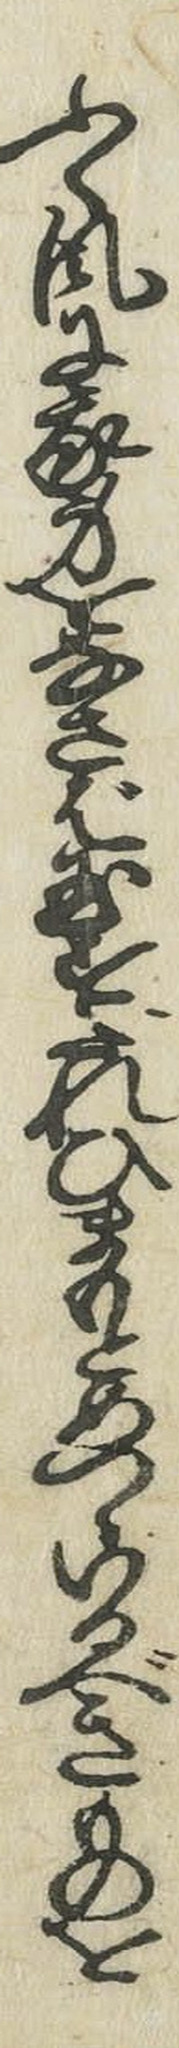ふく風に我身をなさば玉すだれひまもとめつゝいるべきものを
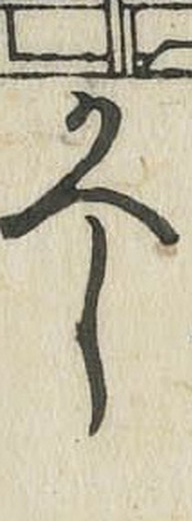かへし
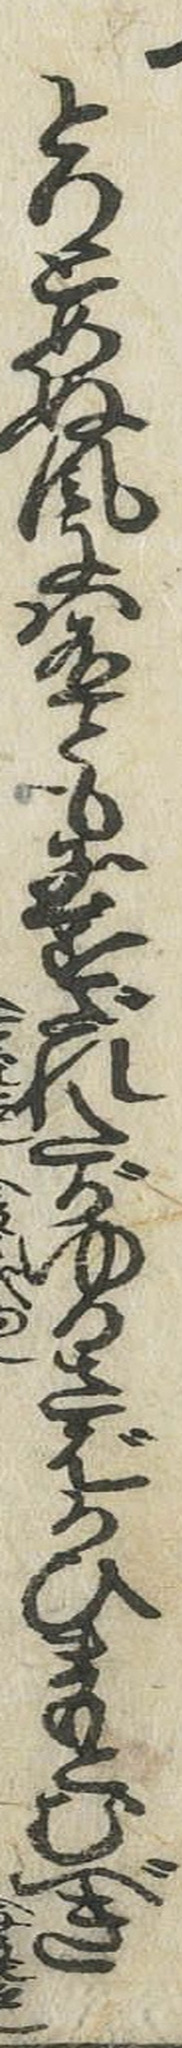とりとめぬ風には有とも玉すだれたがゆるさばかひまもとむべき
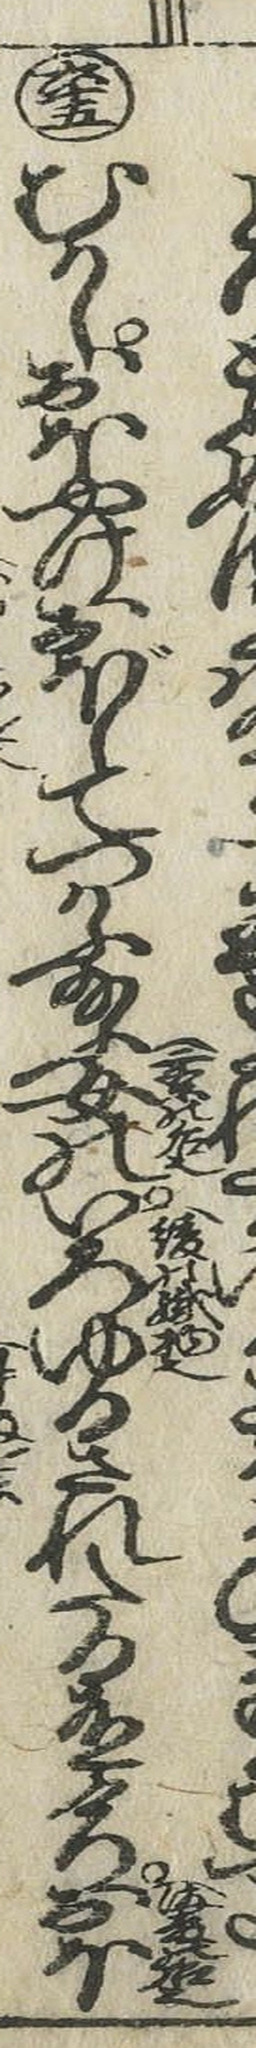(六十五)むかし。おほやけおぼしてつかふ給ふ女の。いろゆるされたる有けり。おほ
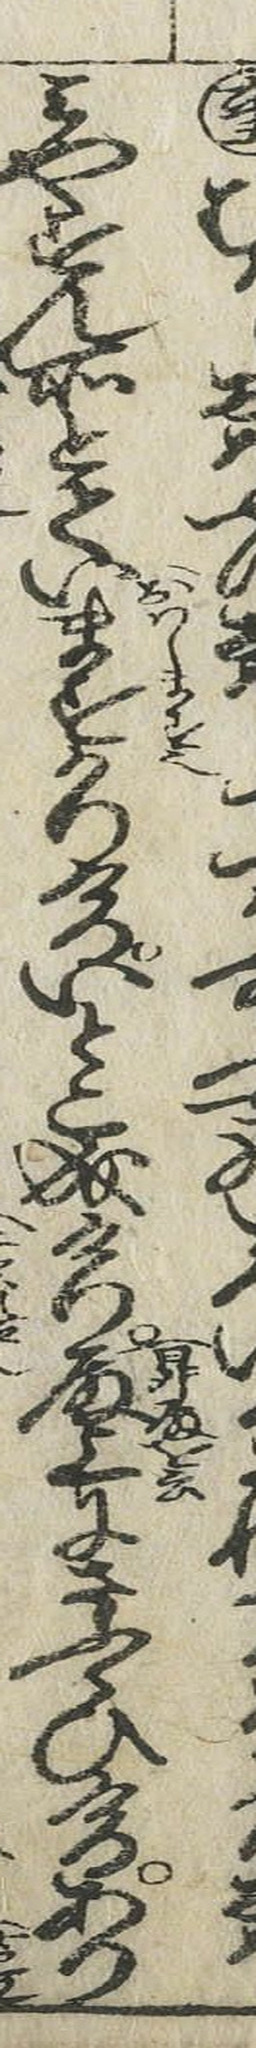みやすん所とていますかりける。いとこ成けり。殿上にさふらひける。あり
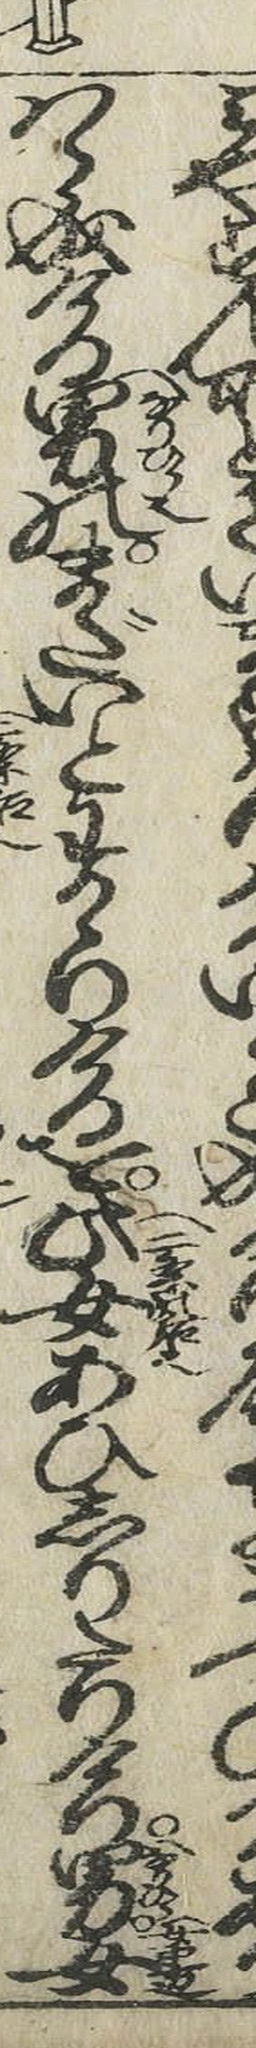はら成ける男の。まだいとわかゝりけるを。此女あひしりたりけり。男。女
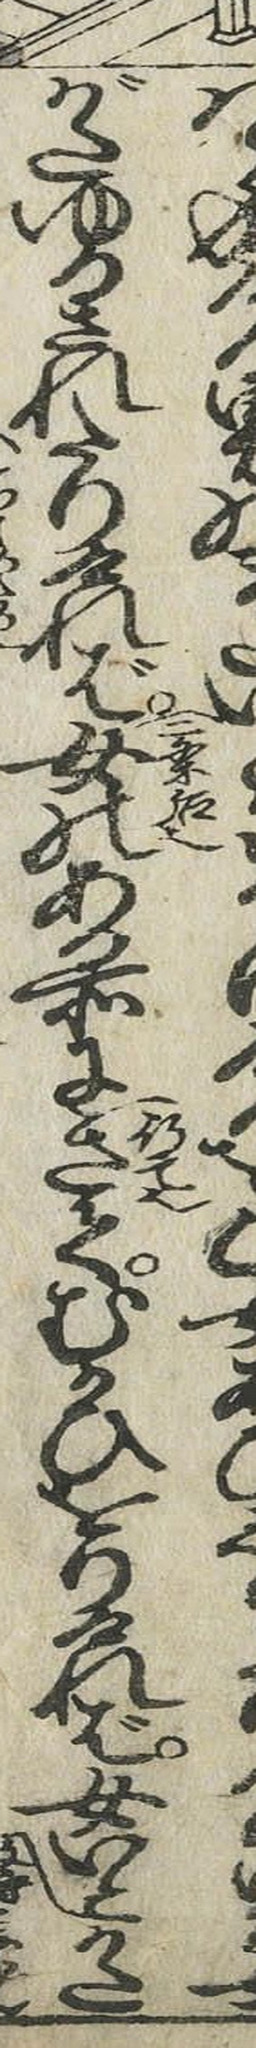がたゆるされたりければ。女のある所にきて。むかひをりければ。女いとかた
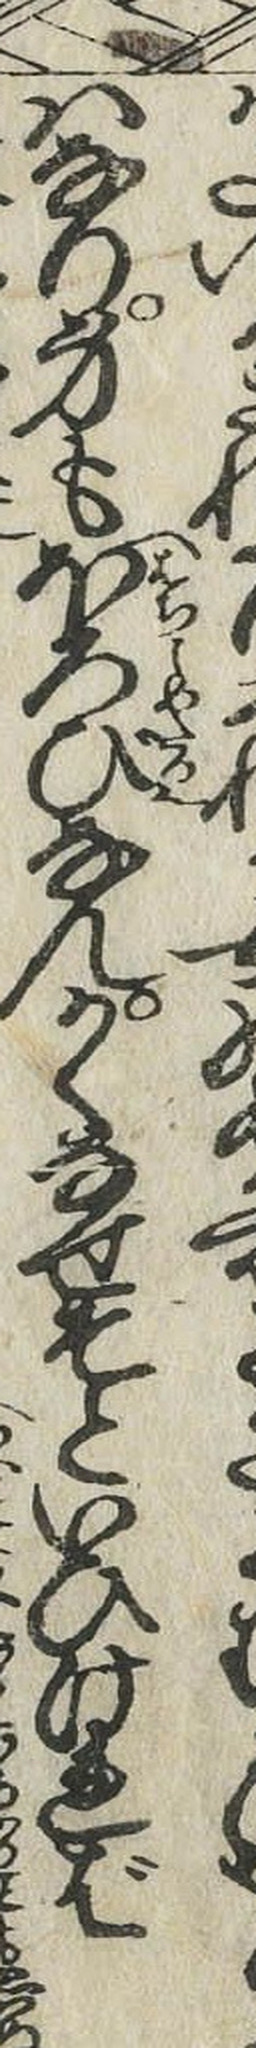はなり。身もほろびなん。かくなせそといひければ
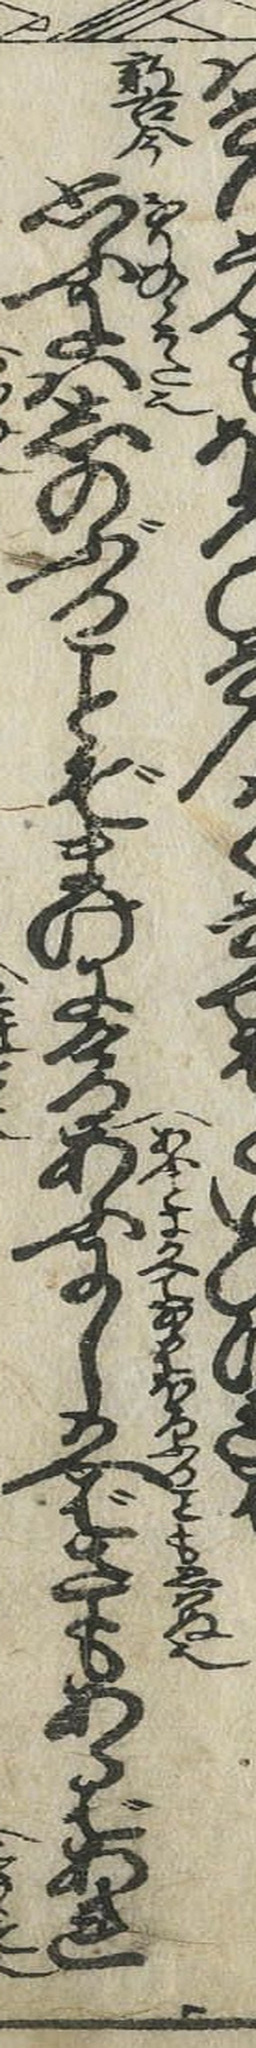新古今思ふにはしのぶることぞまけにけるあふにしかへばさもあらばあれ
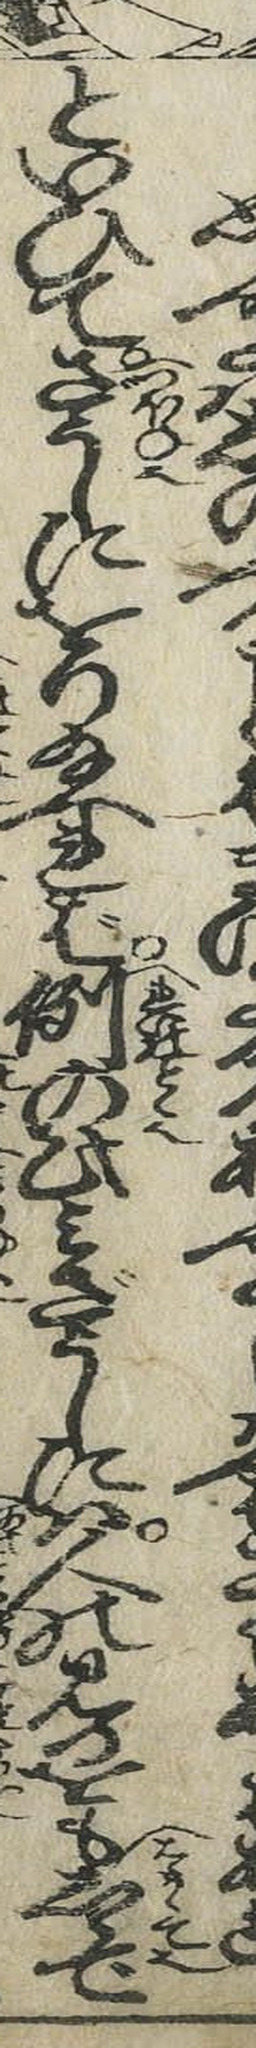といひて。ざうしにをり給へれば。例の此みざうしには。人の見るをもしらで
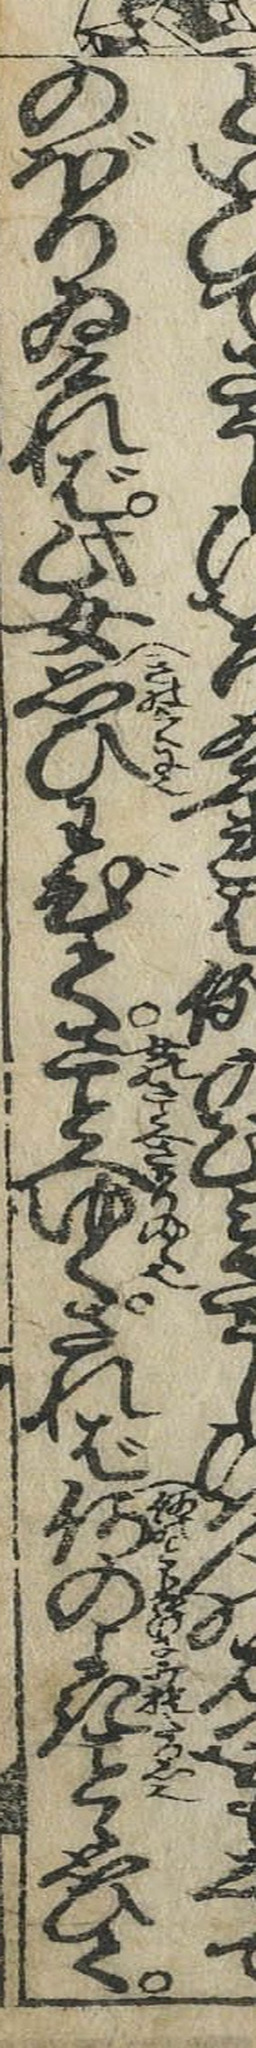のぼりゐければ。此女思ひわびて。さとへゆく。されば何のよきことゝと思ひて。
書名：新板絵入伊勢物語 : かうしやく付 2巻 下
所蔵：東京学芸大学教育コンテンツアーカイブ
